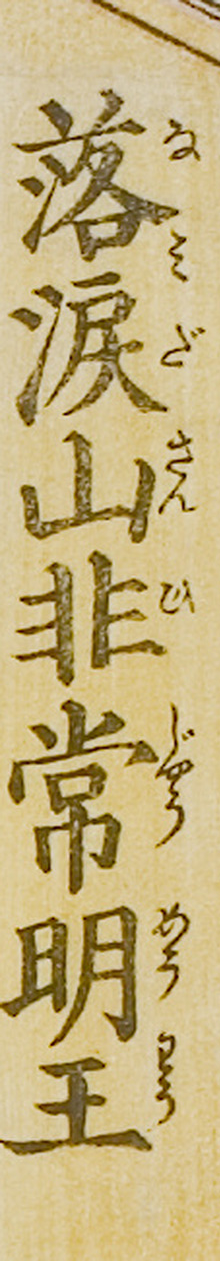落涙山非常明王
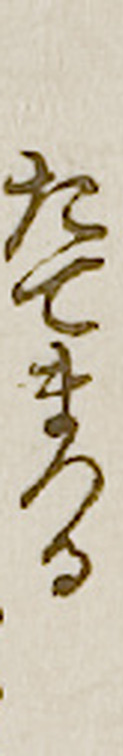たてまつる
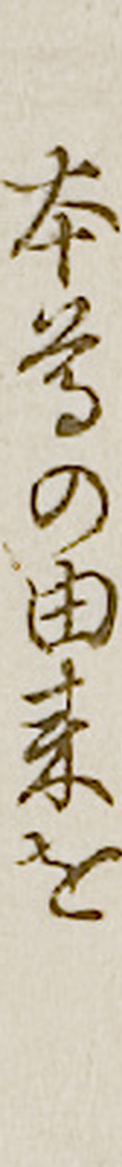本尊の由来を
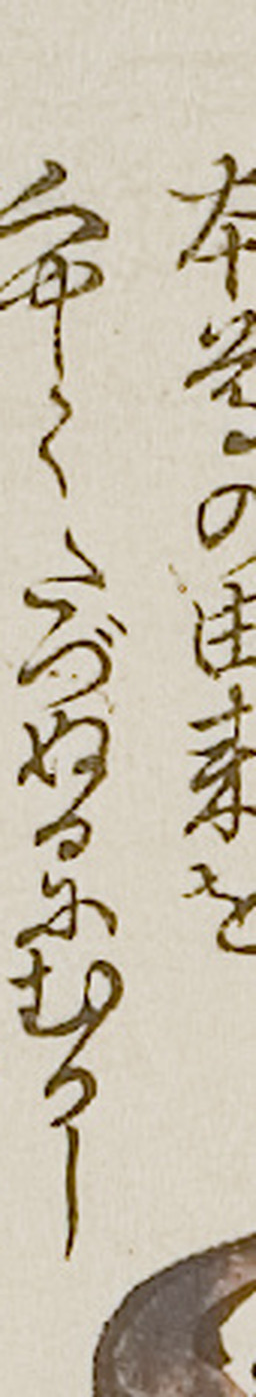くやしくたづぬるにむかし
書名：落涙山非常明王
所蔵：東京大学総合図書館 General Library in the University of Tokyo, JAPAN
